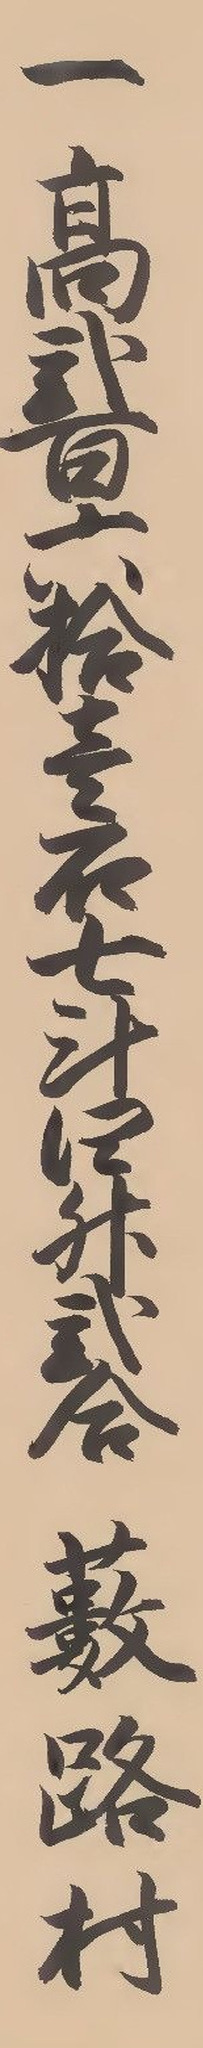一高弐百六拾壱石七斗四升弐合薮路村
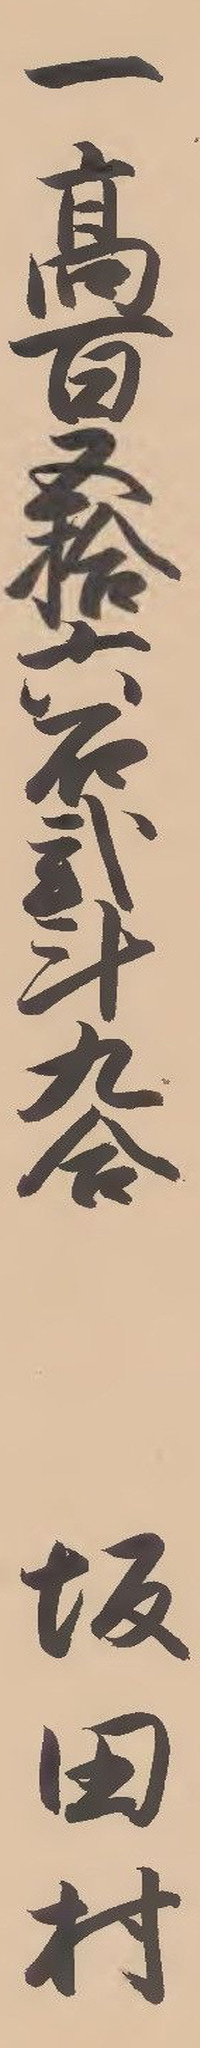一高百五拾六石弐斗九合坂田村
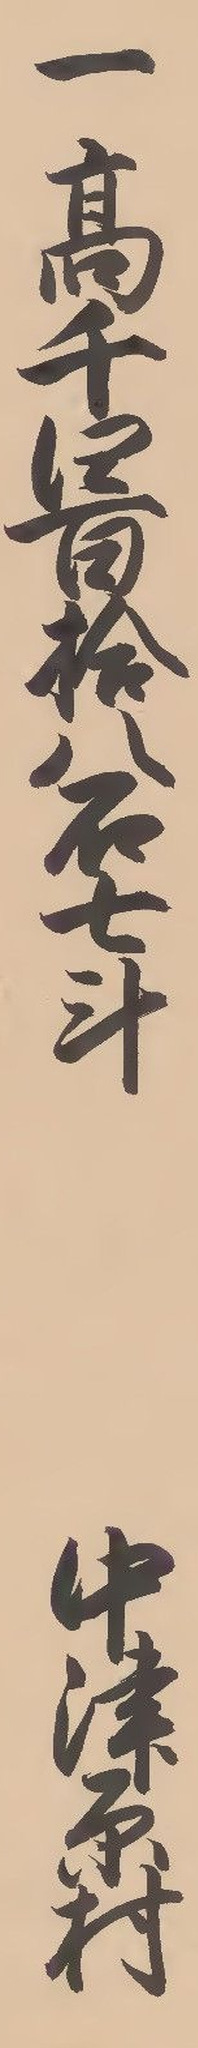一高千四百拾八石七斗中津原村

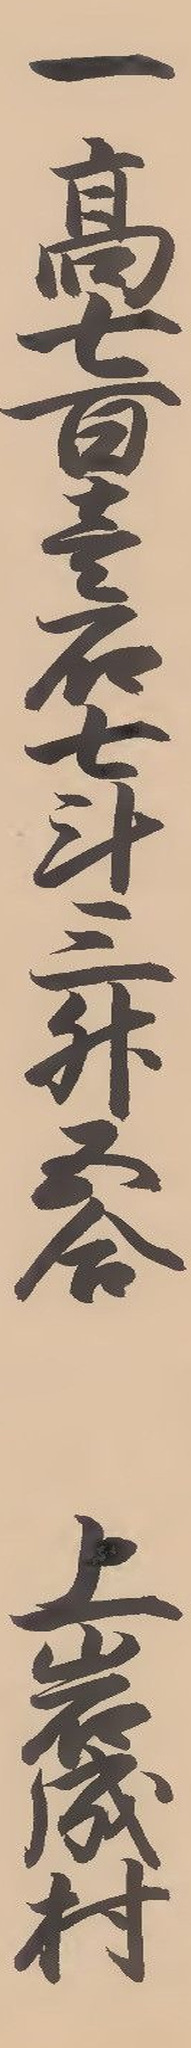一高七百壱石七斗三升五合上岩成村
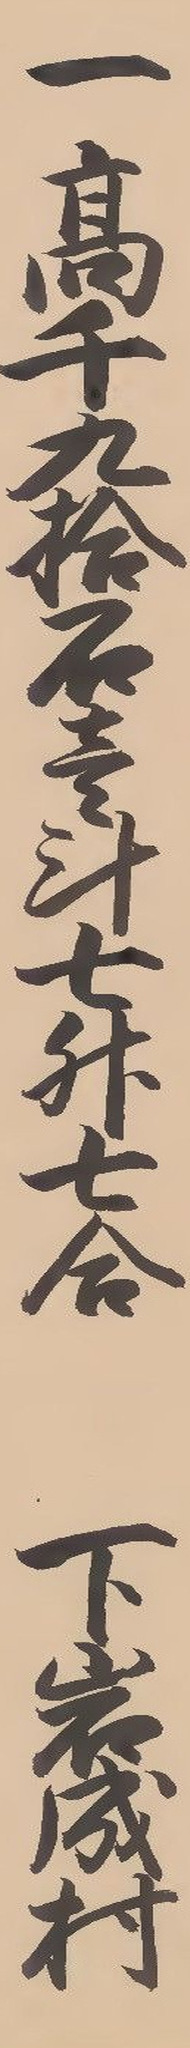一高千九拾石壱斗七升七合下岩成村
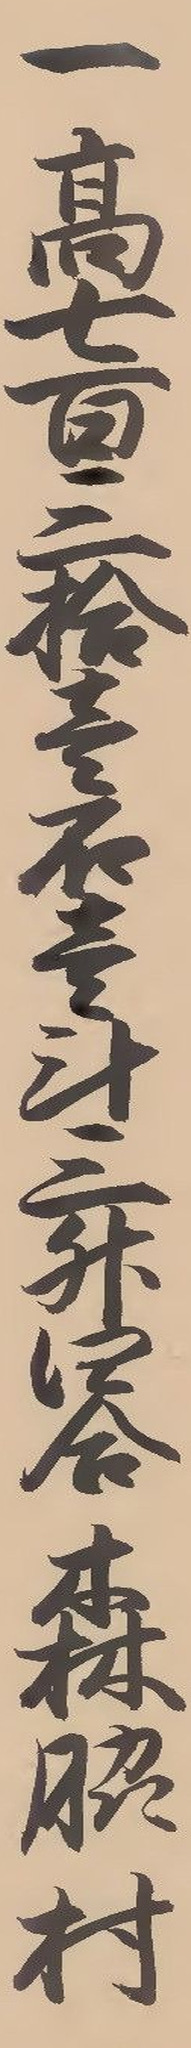一高七百三拾壱石壱斗三升四合森脇村
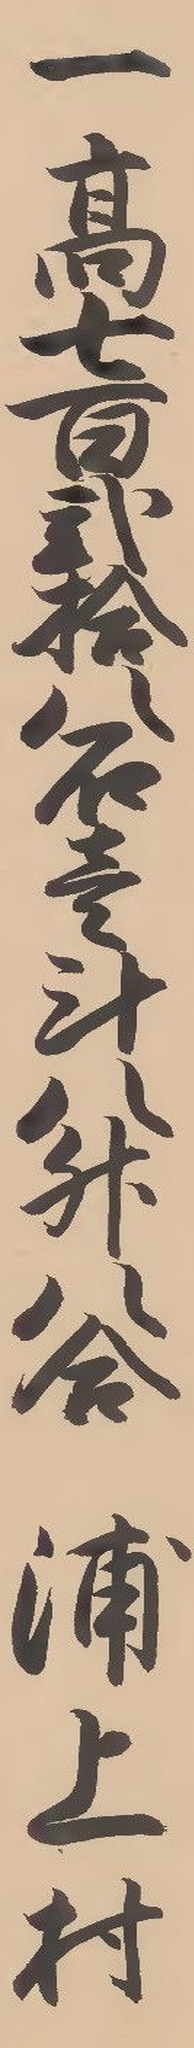一高七百弐拾八石壱斗八升八合浦上村
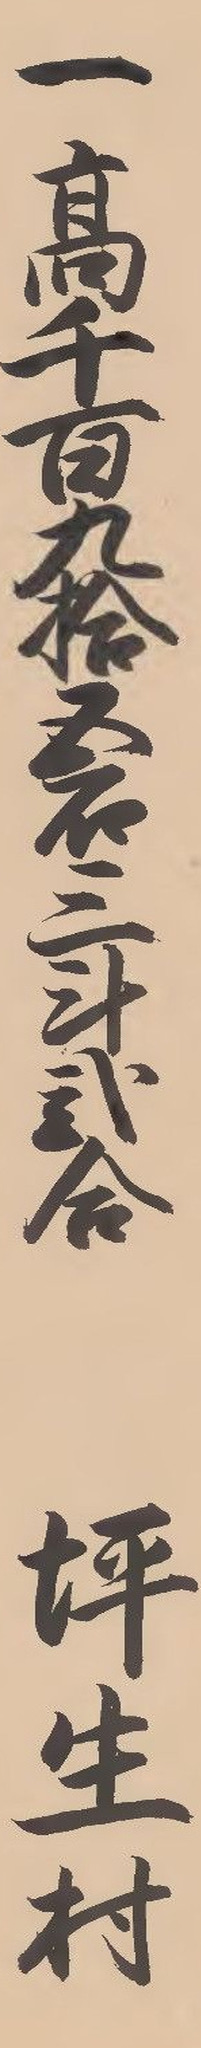一高千百九拾五石三斗弐合坪生村
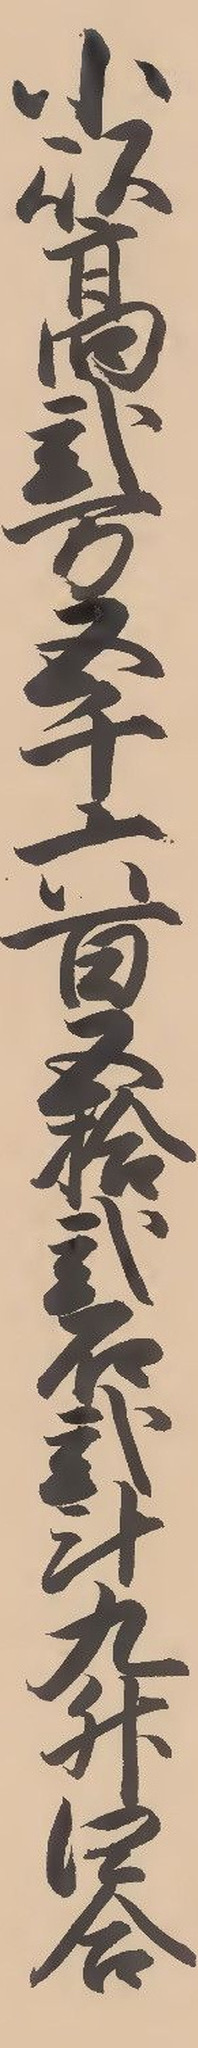小以高弐万五千六百五拾弐石弐斗九升四合

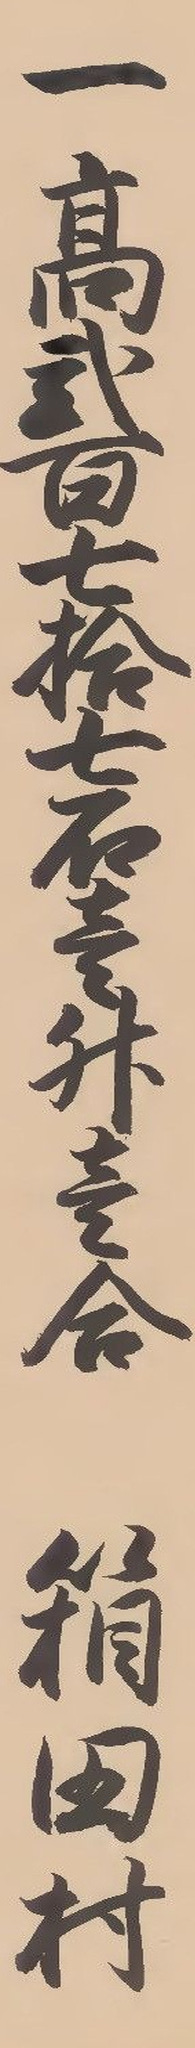一高弐百七拾七石壱升壱合箱田村
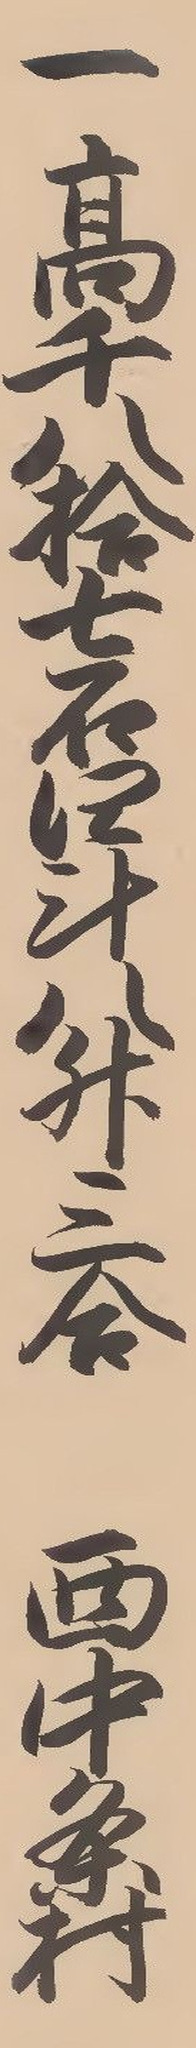一高千八拾七石四斗八升三合西中条村
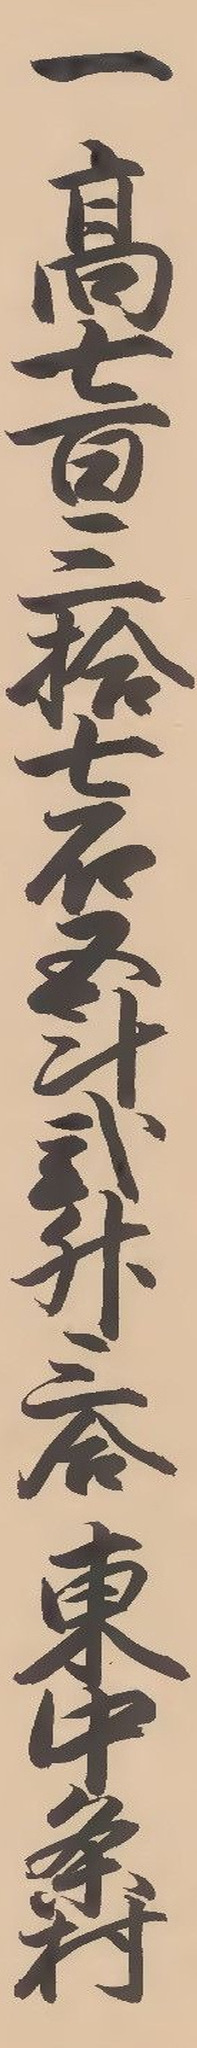一高七百三拾七石五斗弐升三合東中条村
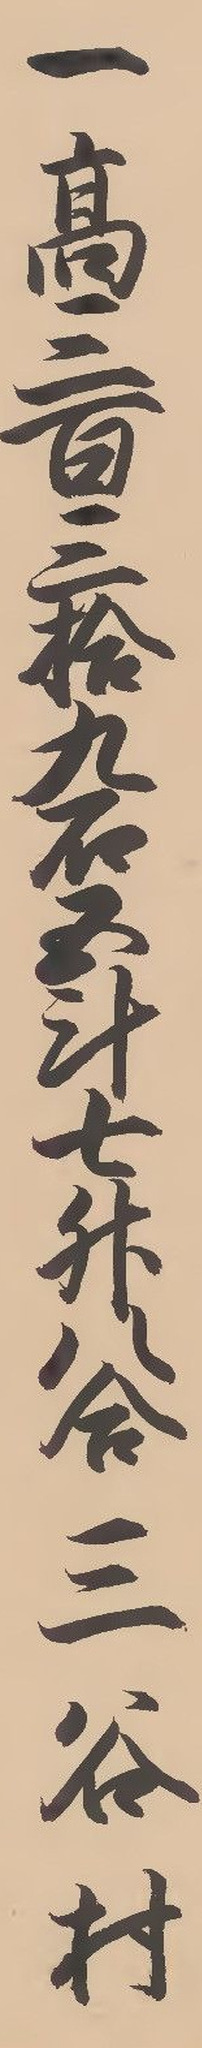一高三百三拾九石五斗七升八合三谷村
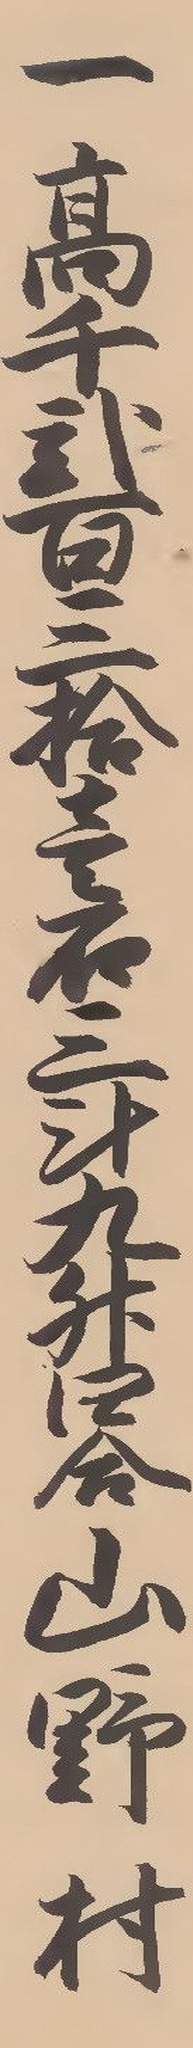一高千弐百三拾壱石三斗九升四合山野村
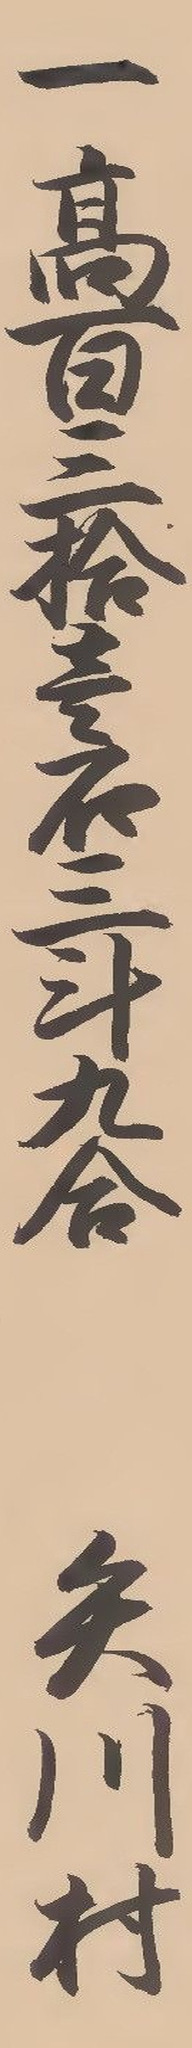一高百三拾壱石三斗九合矢川村
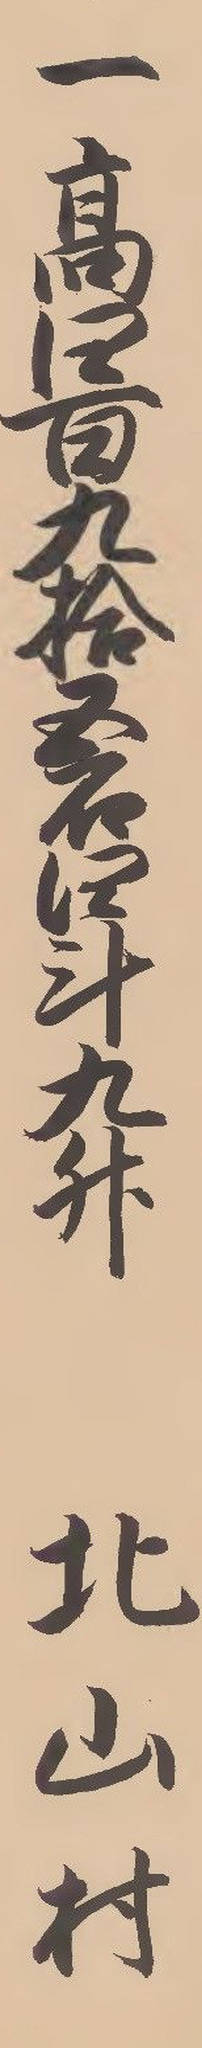一高四百九拾五石四斗九升北山村
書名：備後国郷帳
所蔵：国立公文書館 National Archives of Japan
